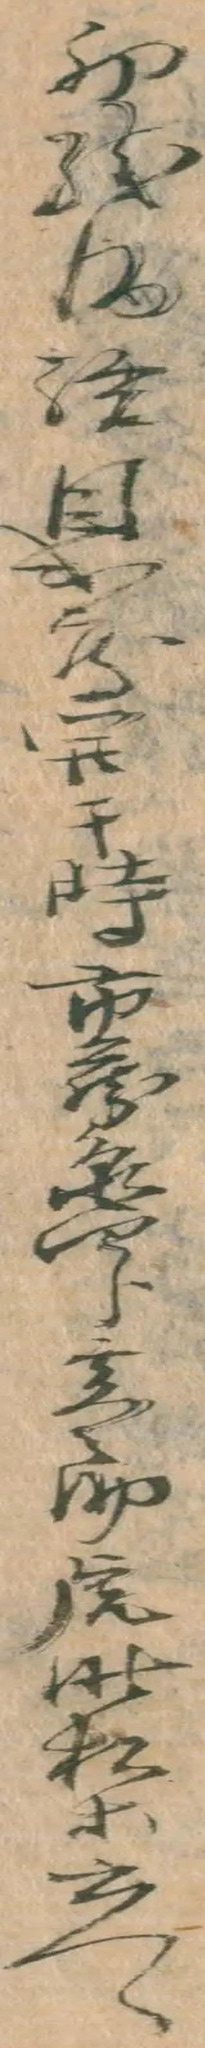初残酒活目出度開于時市蔵亀四郎亥之助虎昨松等六人へ
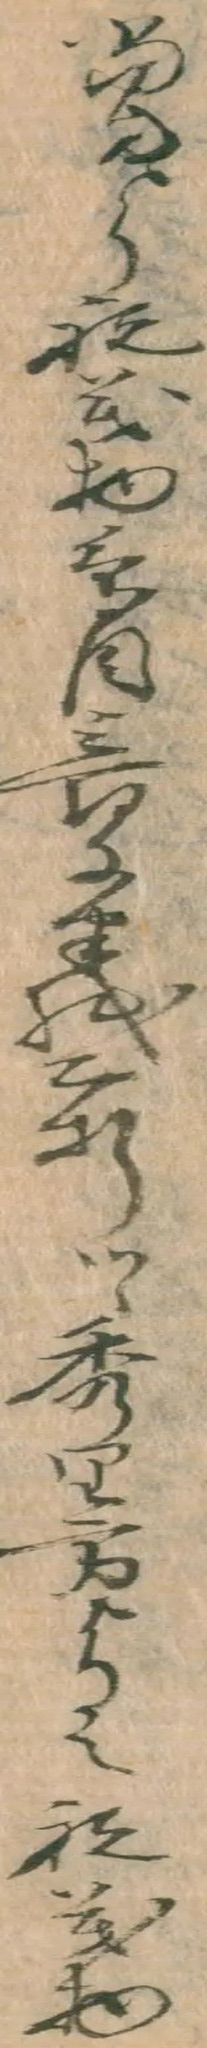當方より祝義物鳥目三百文半紙二折ツヽ秀里方より之祝義物
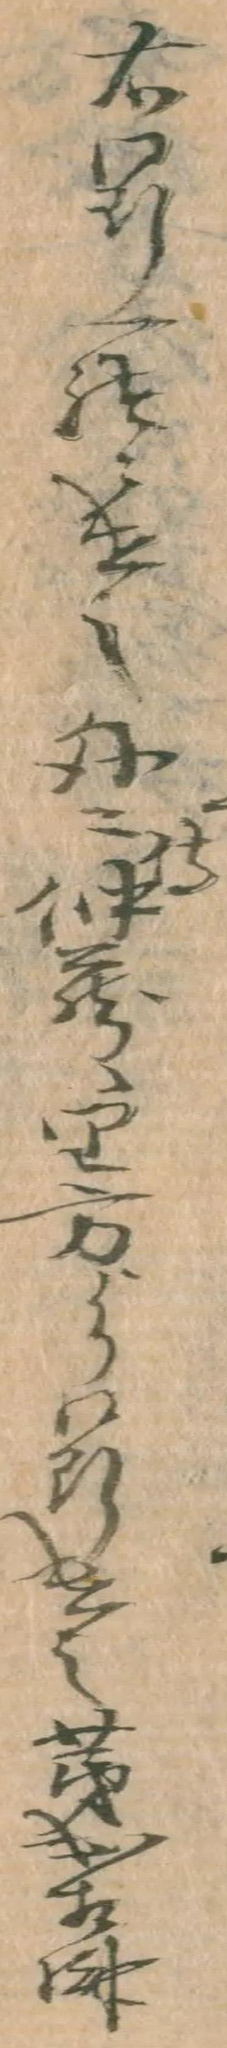右同断一張出也外ニ侍仲蔵へ里方より同断遣之芽出相済
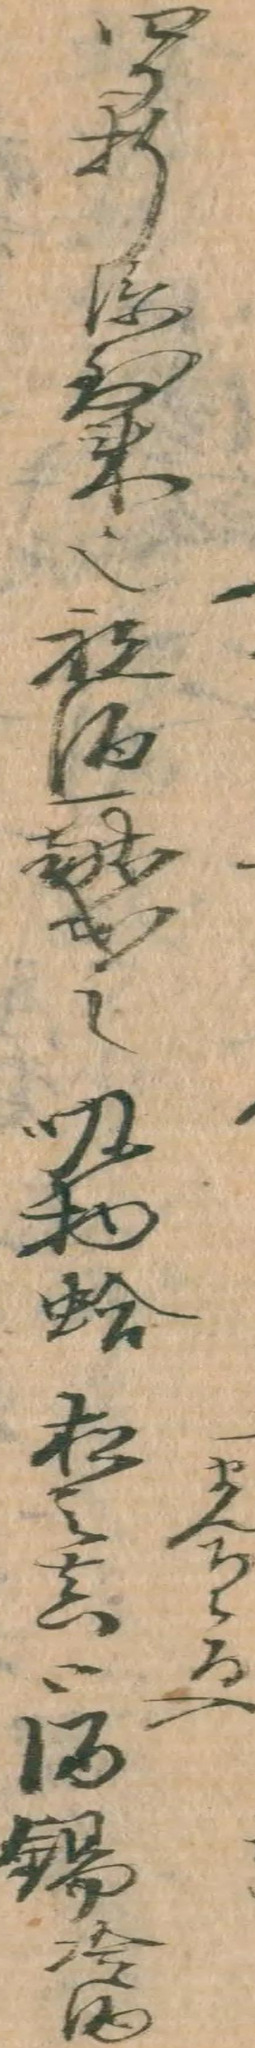四ツ折添到来也祝酒一献出之吸物蛤松之真酒錫冷酒
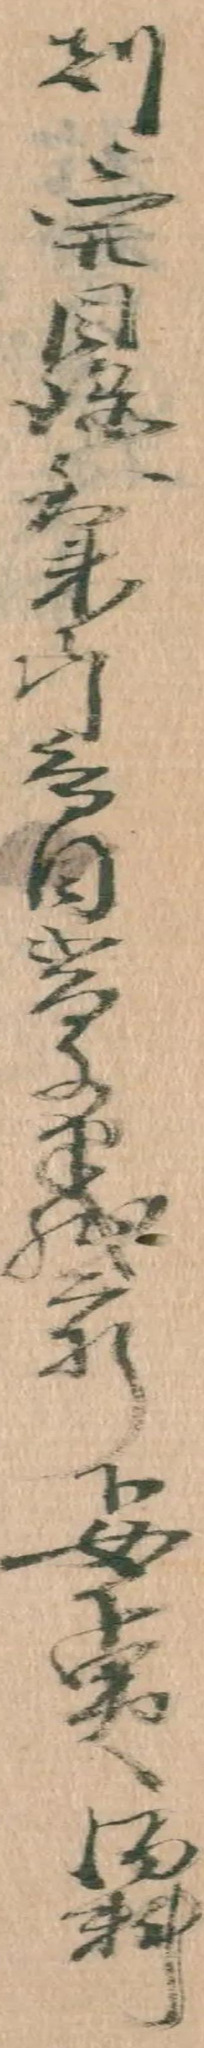刻被開目録到来候引鳥目弐百文半紙二折下女下男へ酒料
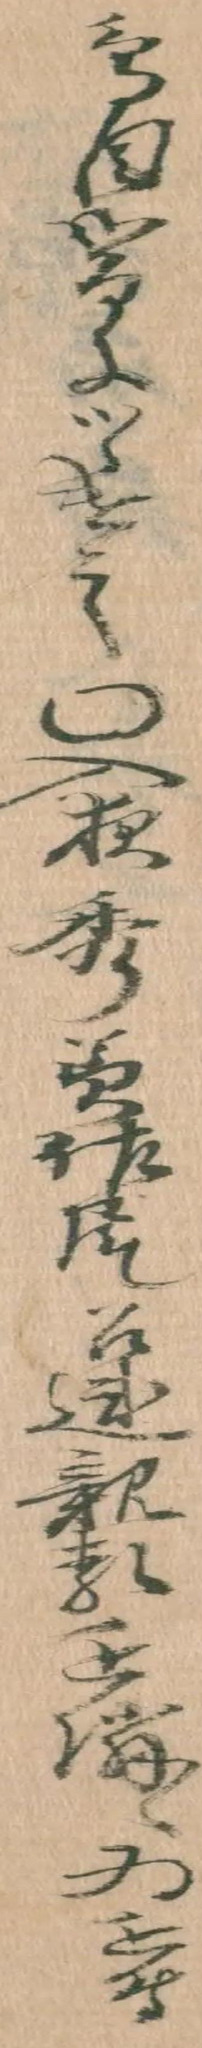鳥目弐百文ツヽ遣之〇入夜秀美佐尾召連親類近消ヘ為近付
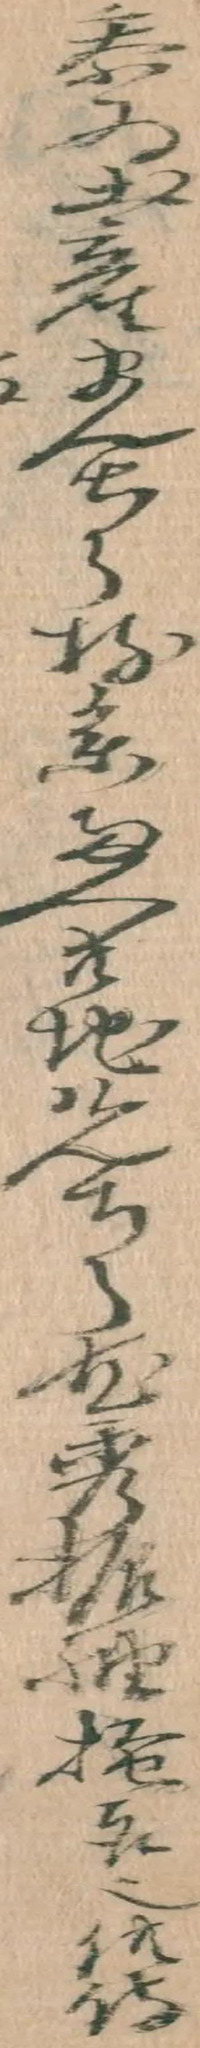参為土産まんちう持参両人共地まんちう尤秀振袖捲取也供侍
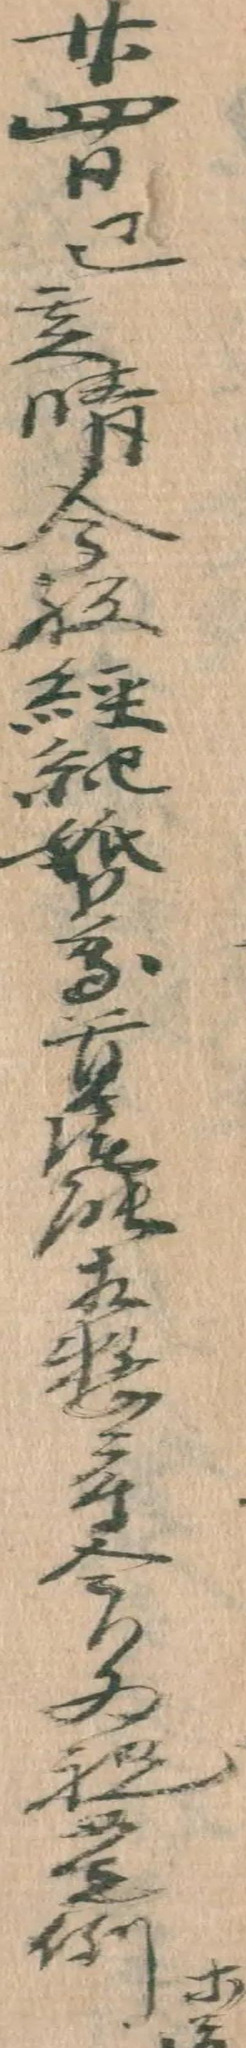廿四日己亥晴今般経紀婚義首尾能相務ニ付今日為祝如例
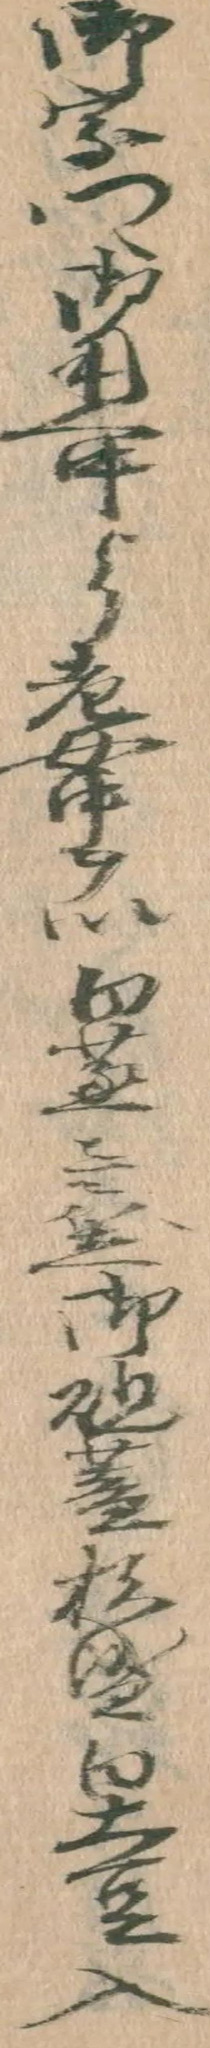御家門へ御用人中より老女中を以白蒸壱器御硯蓋杉盛白土豆入
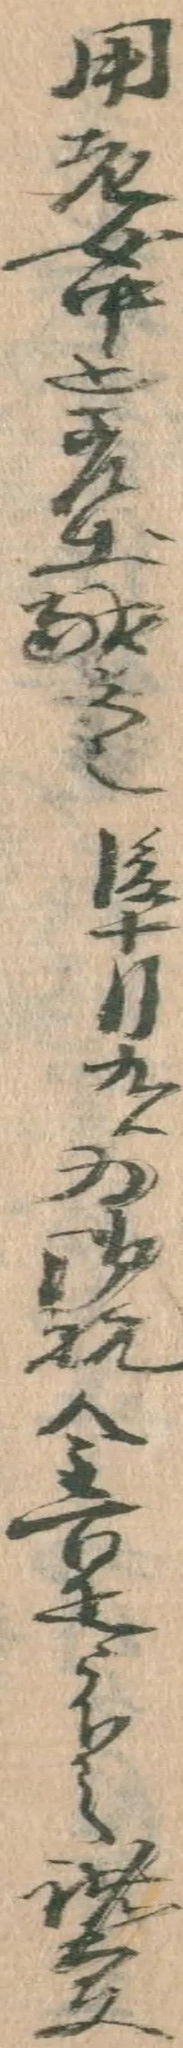用老女中迄差出献有之後十月九日為御祝金百疋被下也諸大夫
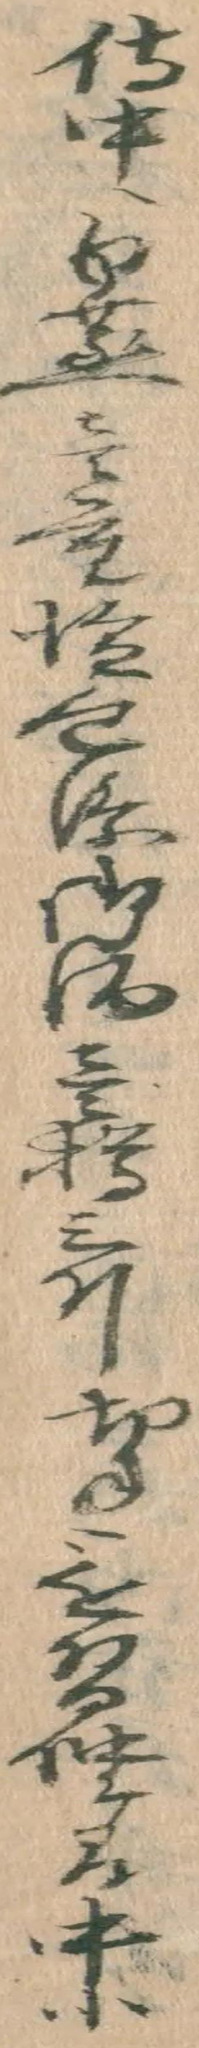侍中へ白蒸壱重塩包添御酒壱樽三升切手御近習仲ヶ間中小
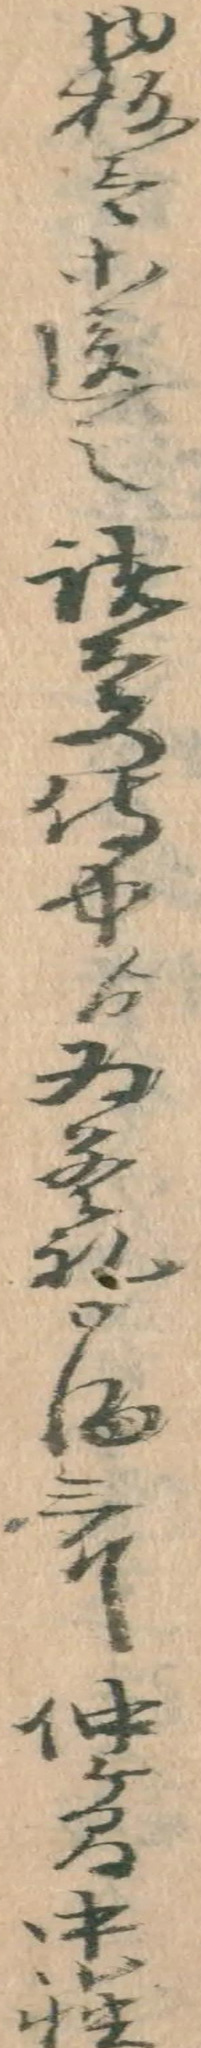内板壱等送也諸大夫侍中ゟ為答礼御酒三升仲ヶ間中小性

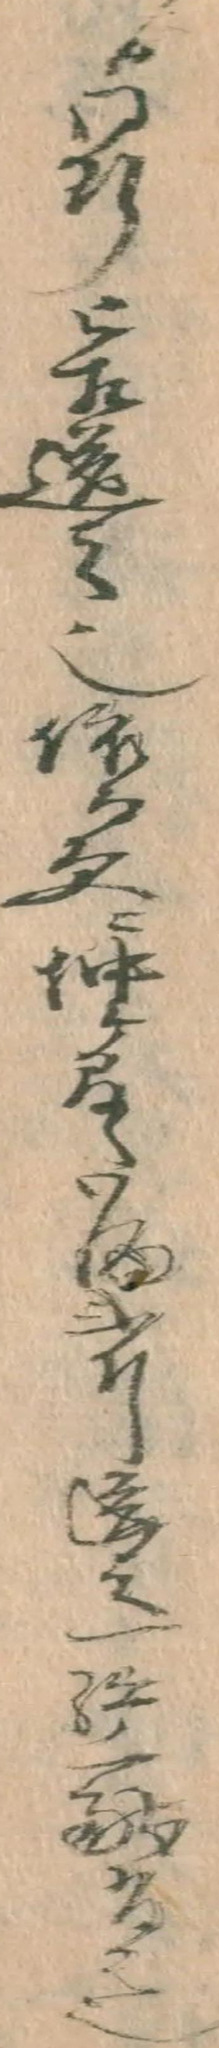ゟ同断被相送之也依而更ニ仲ヶ間之御酒弐升送之一統一献有之也
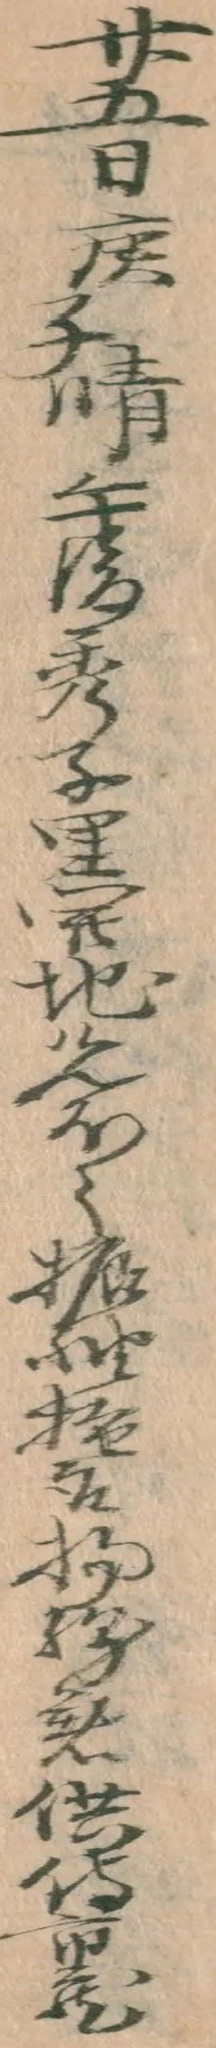廿五日庚午晴午後秀子里開地めほう振袖捲取持被着供侍市蔵
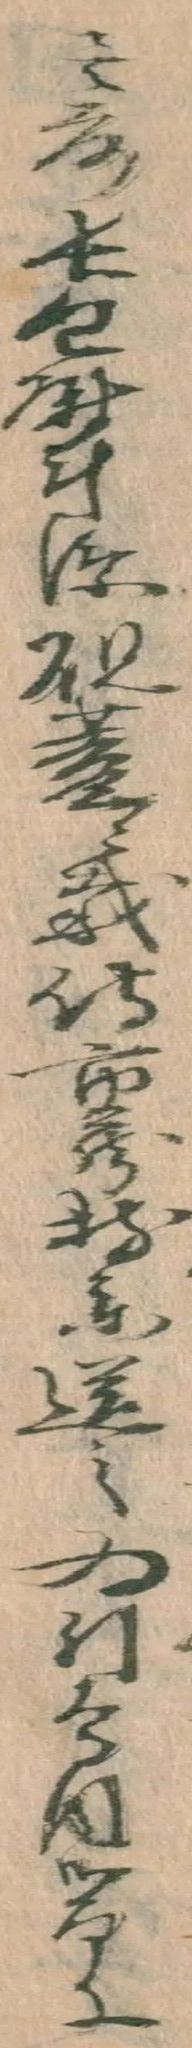之度長包尉斗添硯蓋ニ戴侍市蔵持参送之為引鳥目弐百文
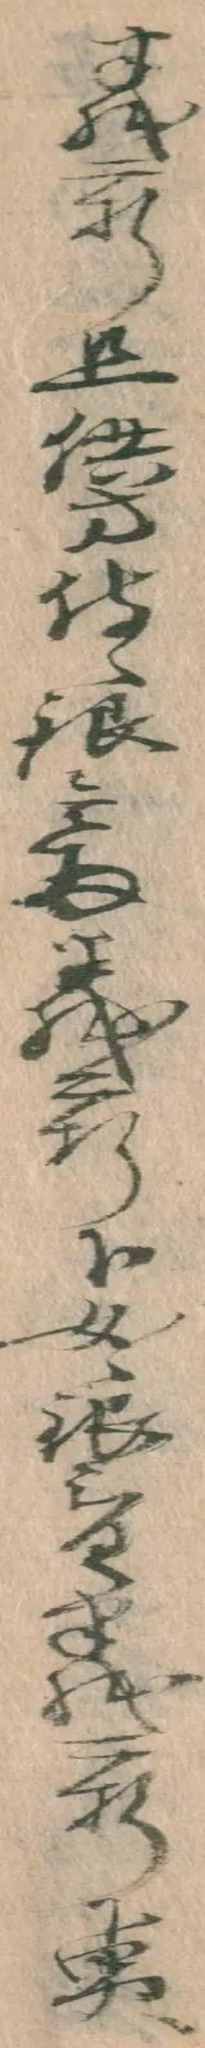半紙二折且供方侍へ銀壱半紙二折下女ヘ銀三匁半紙二折下男へ
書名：賀茂社記録. 第69冊
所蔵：国立国会図書館 National Diet Library, JAPAN
